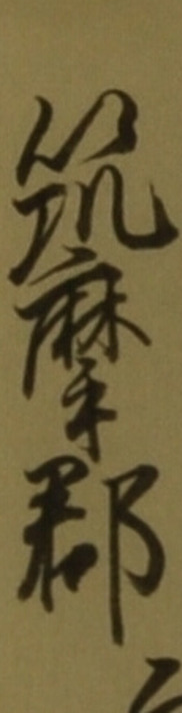筑摩郡

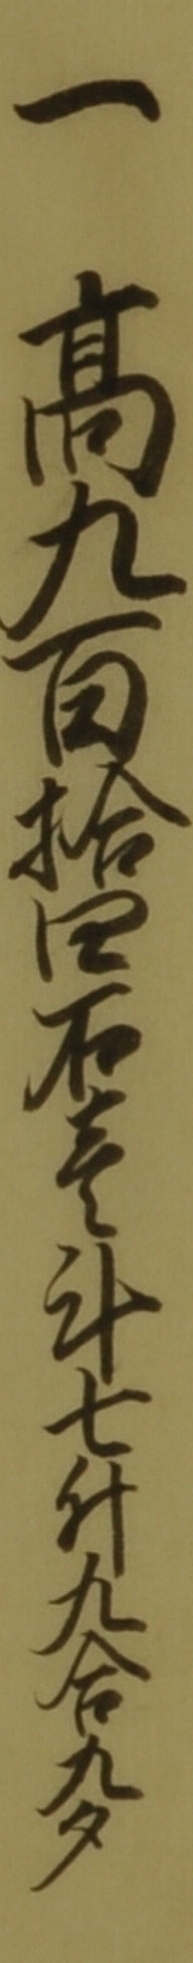一高九百拾四石壱斗七升九合九勺
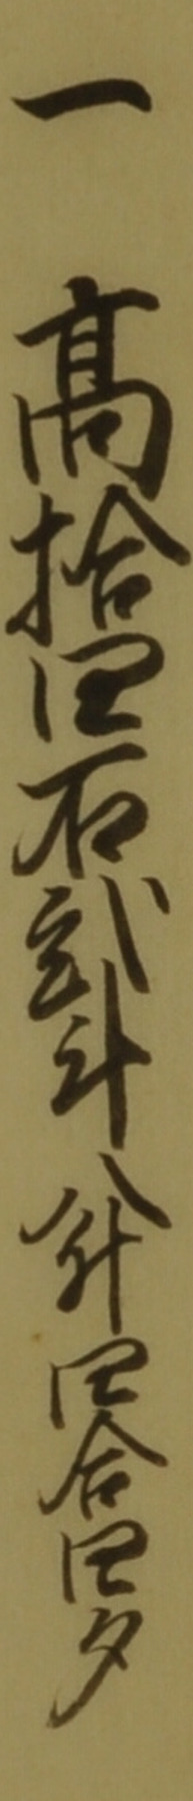一高拾四石弐斗八升四合四勺
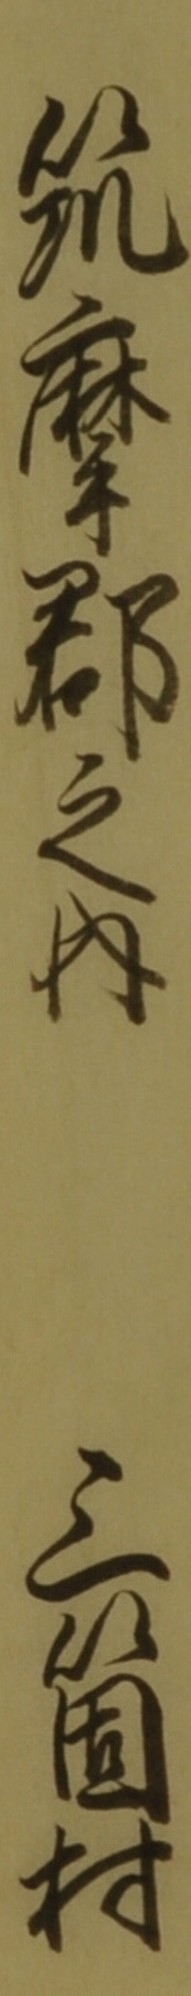筑摩郡之内三箇村
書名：信濃国伊那郡筑摩郡高遠領知郷村高辻帳
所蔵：伊那市立高遠町図書館・合同会社AMANE
